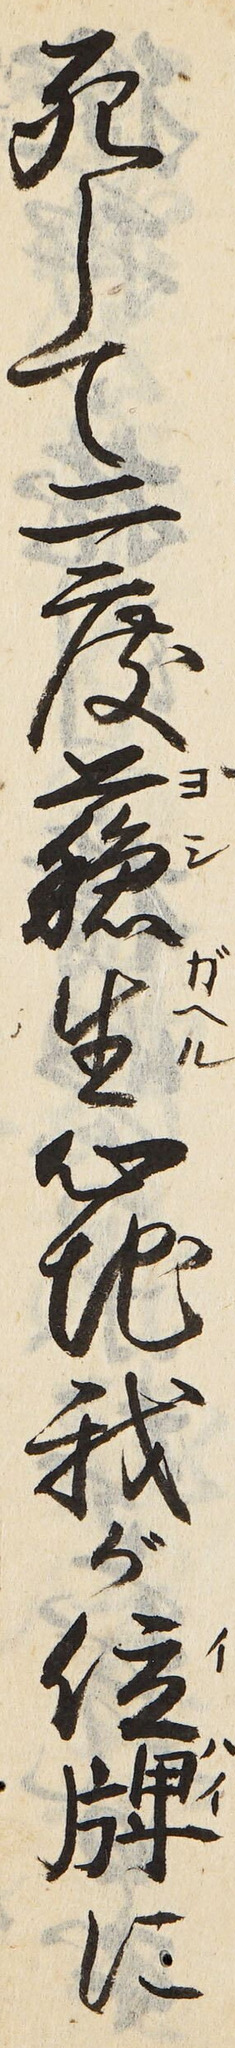死して二度蘇生心地我が位牌に
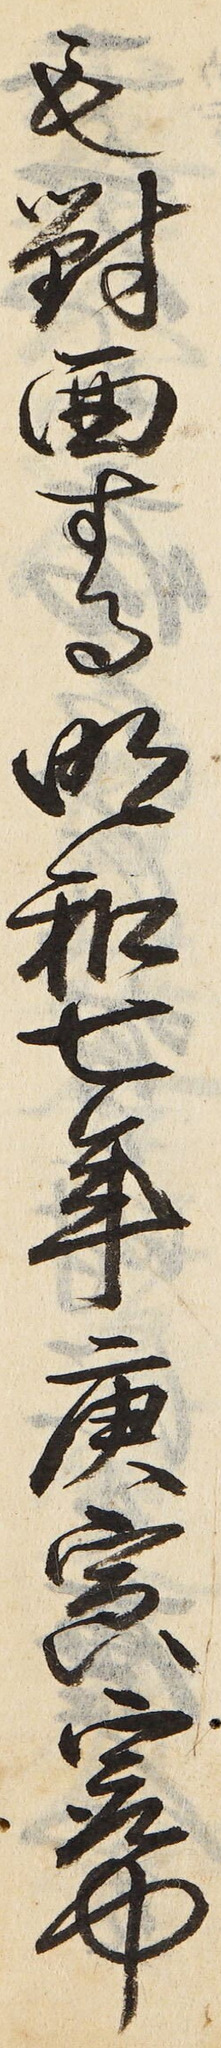も対面する明和七年庚寅最中
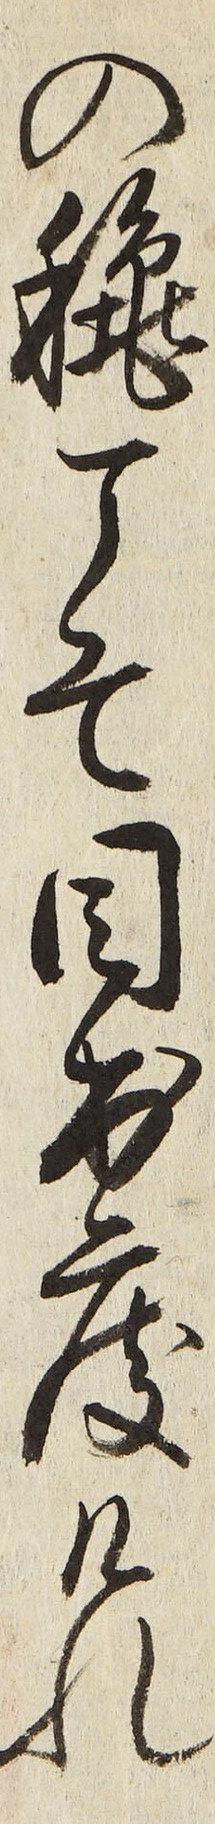の龝こそ目出度けれ
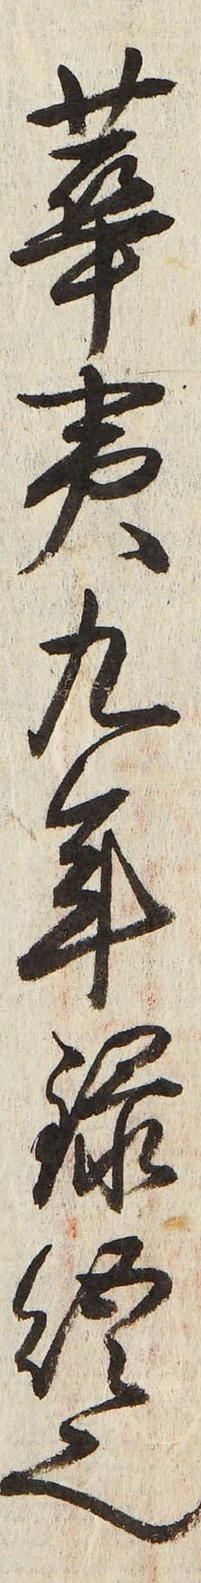華夷九年録終也
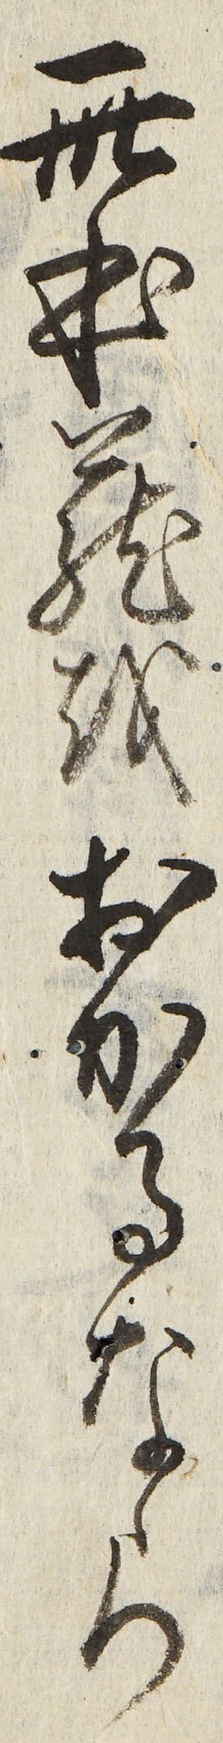此本籠をおかるなら
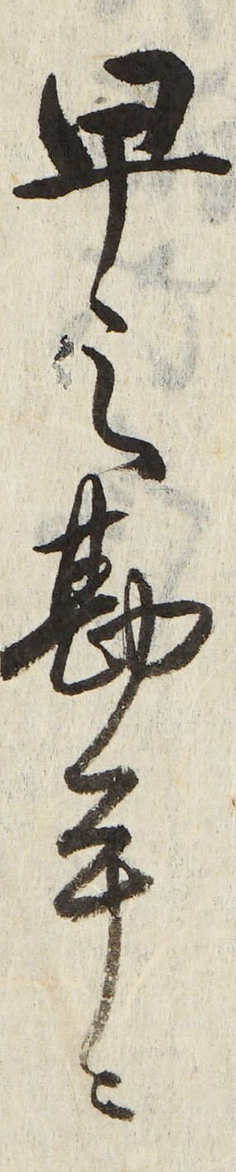早々勘平に
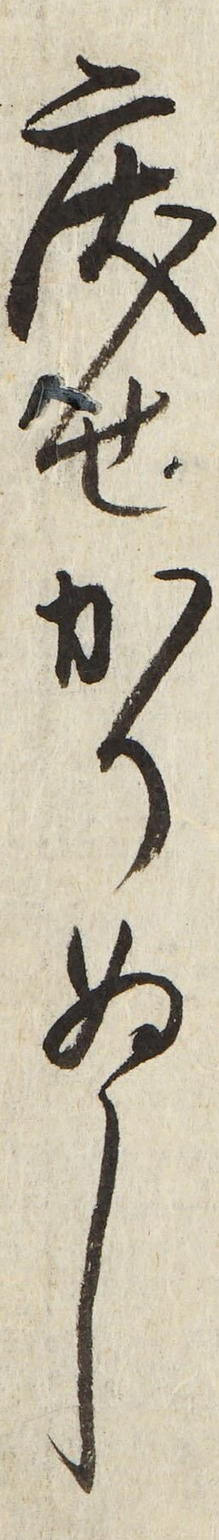戻せかりぬし

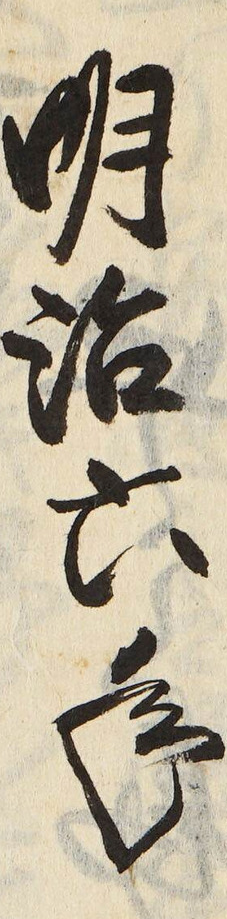明治六年
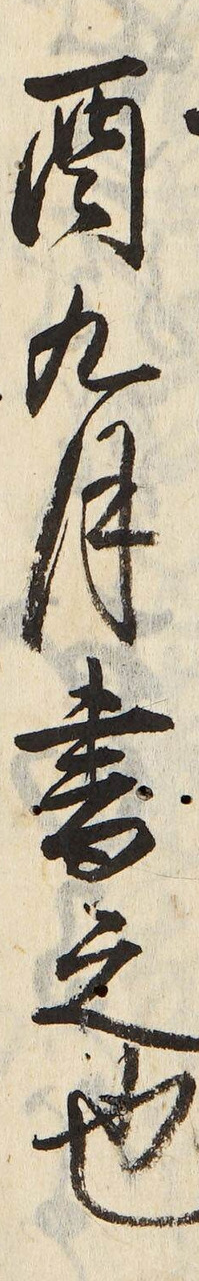酉九月書之也
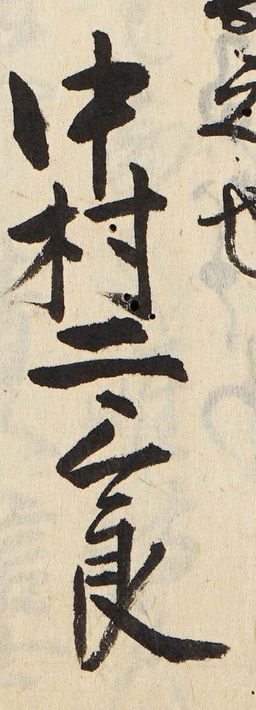中村二三良
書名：華夷九年録
